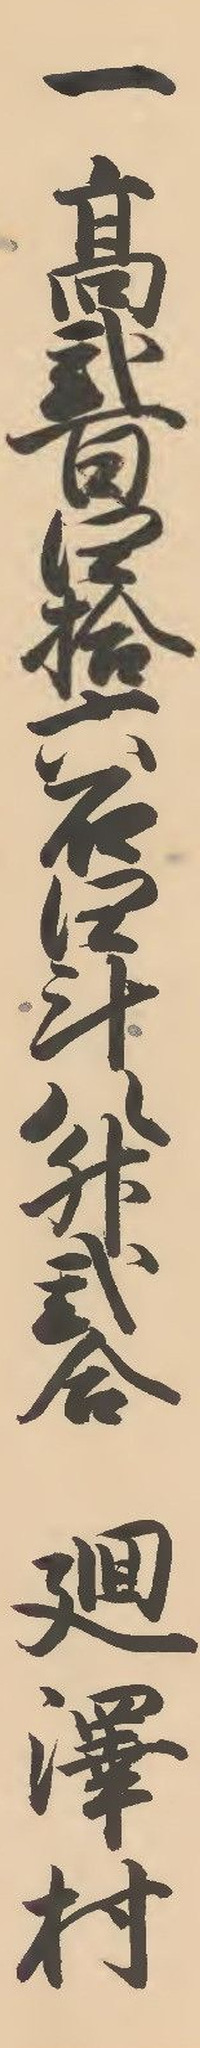一高弐百四拾六石四斗八升弐合廻澤村

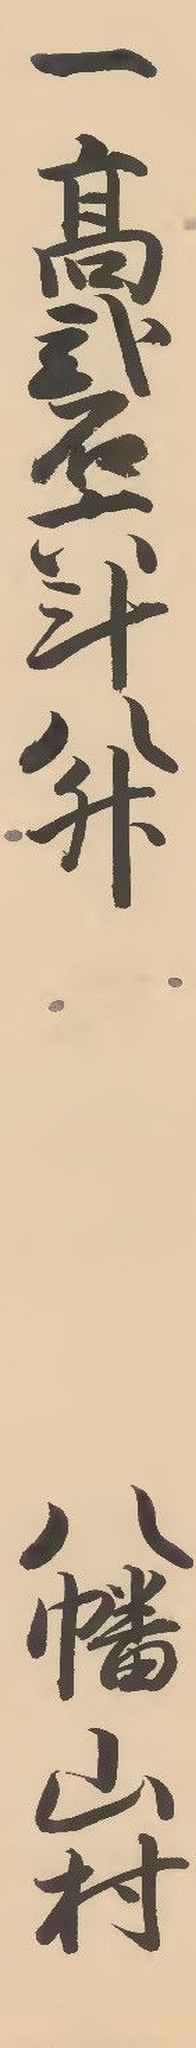一高弐石六斗八升八幡山村
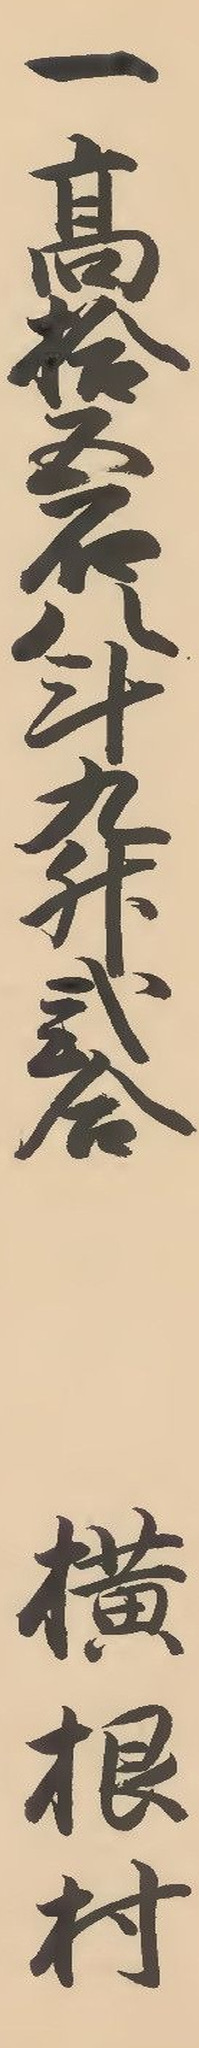一高拾五石八斗九升弐合横根村
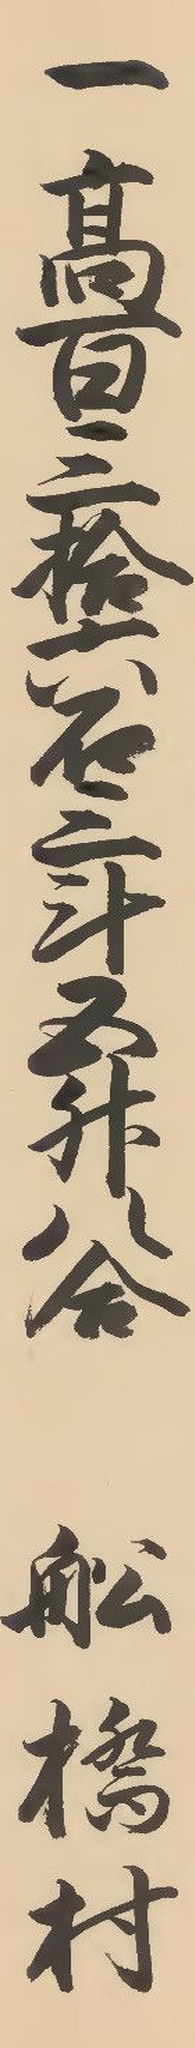一高百三拾六石三斗五升八合船橋村
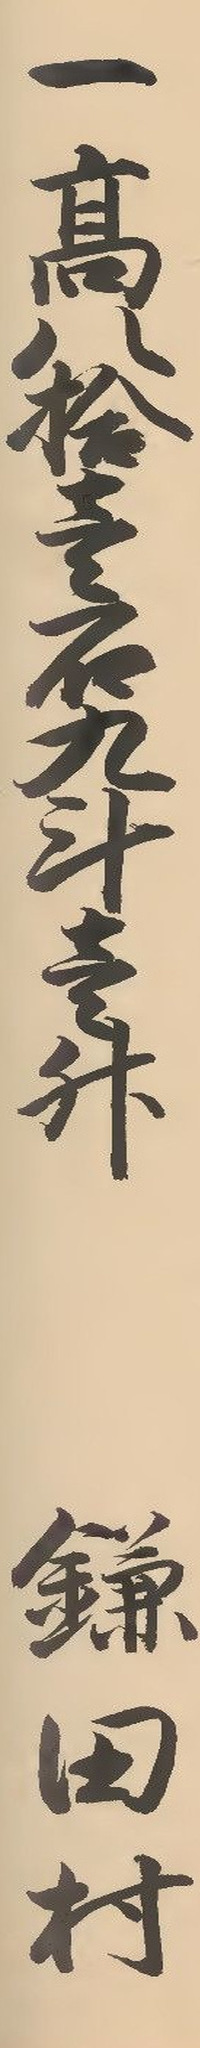一高八拾壱石九斗壱升鎌田村
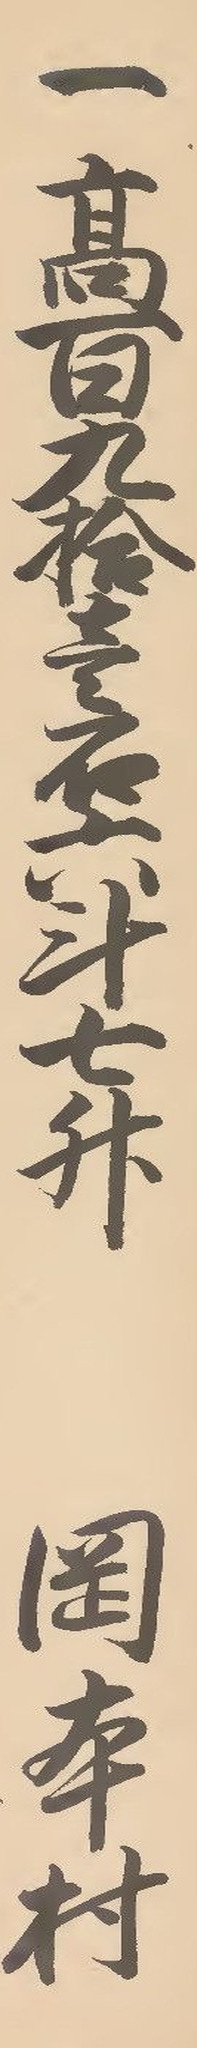一高百九拾壱石六斗七升岡本村
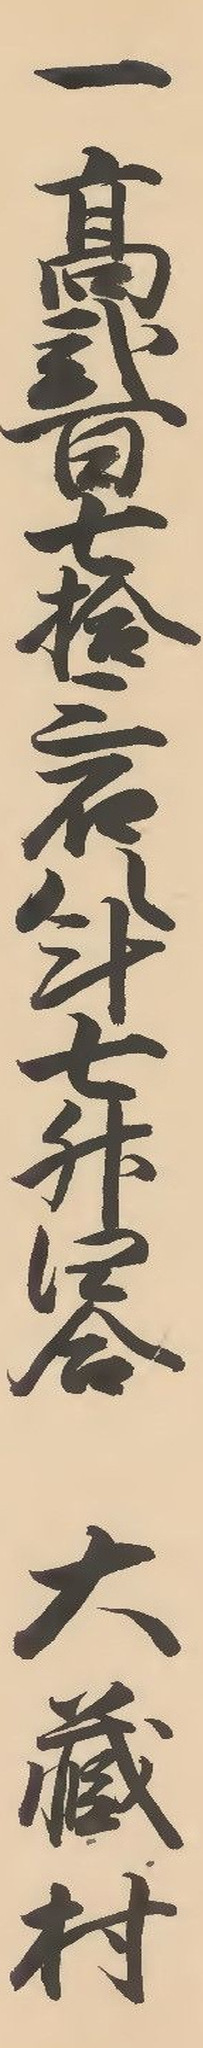一高弐百七拾三石八斗七升四合大蔵村
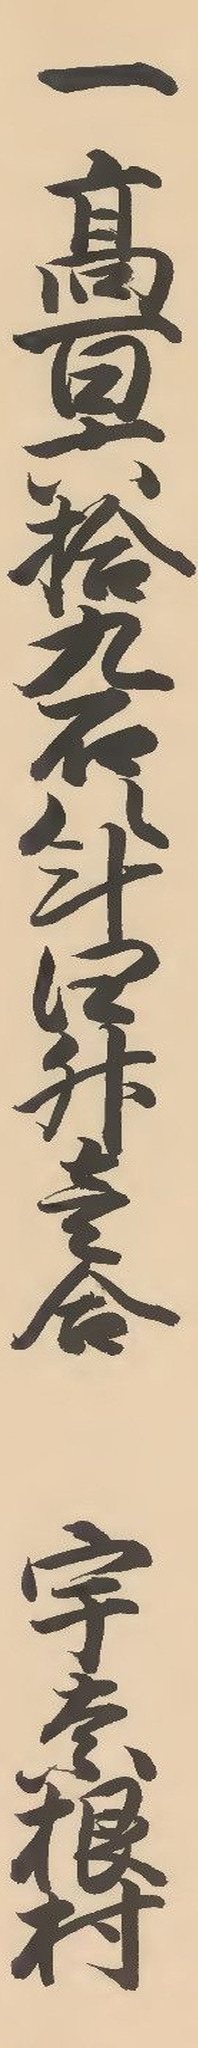一高百六拾九石八斗四升壱合宇奈根村
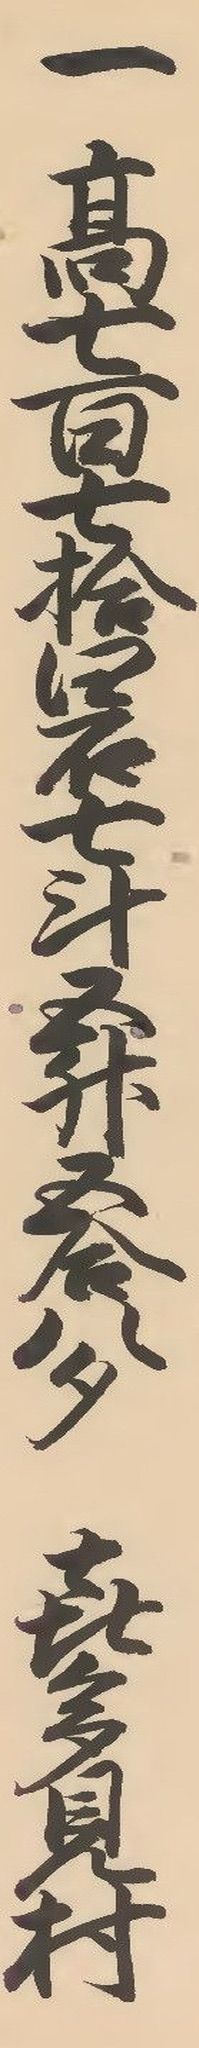一高七百七拾四石七斗五升五合八勺喜多見村

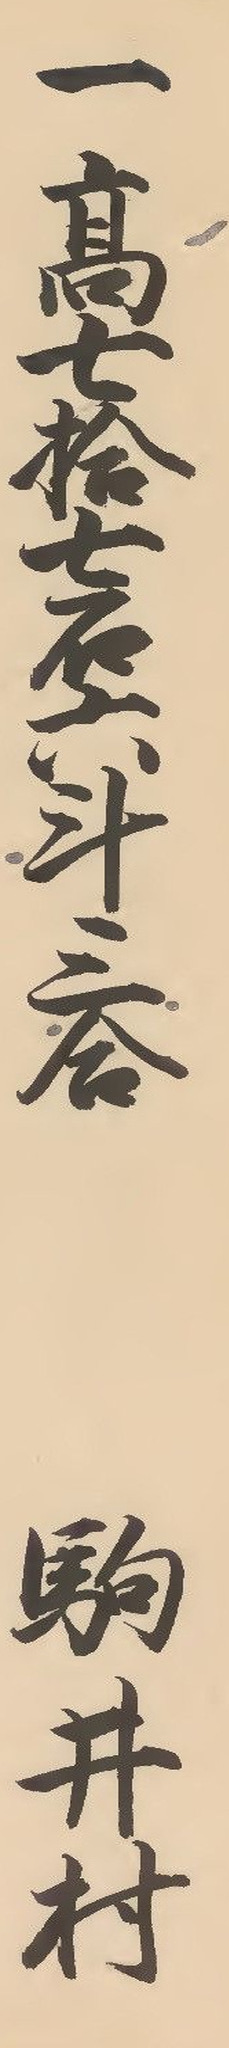一高七拾七石六斗三合駒井村
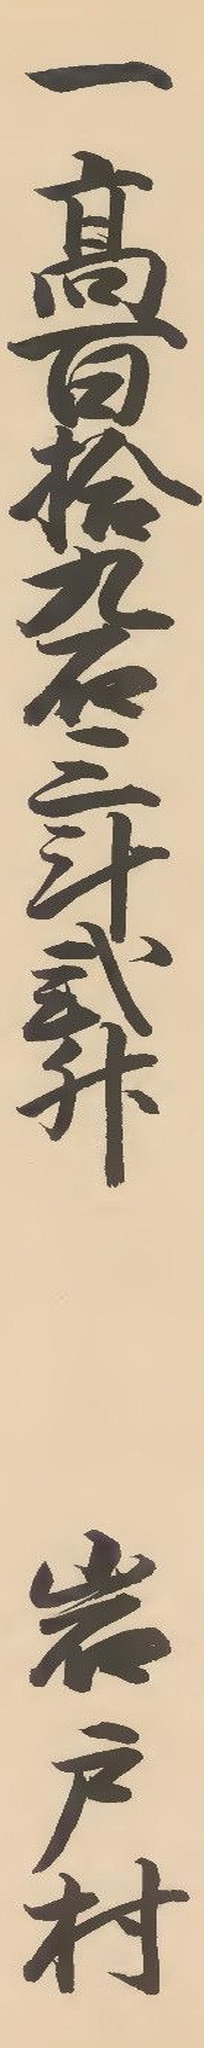一高百拾九石三斗弐升岩戸村
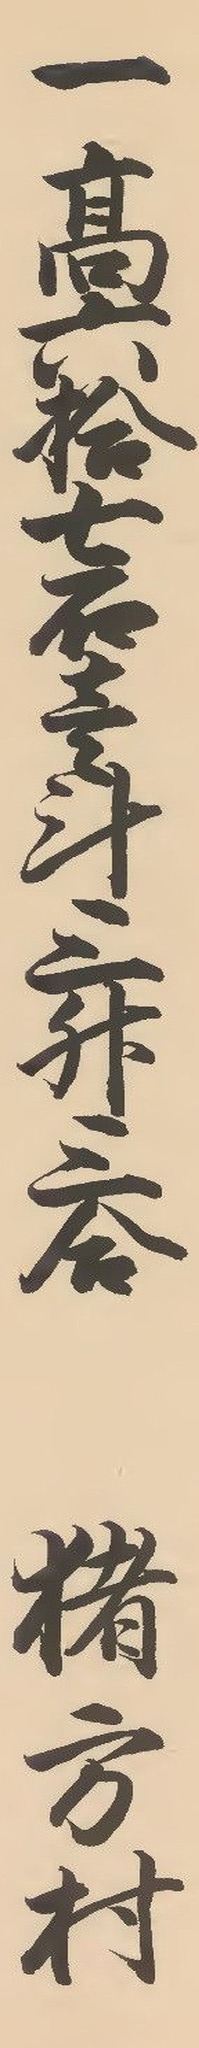一高六拾七石壱斗三升三合猪方村
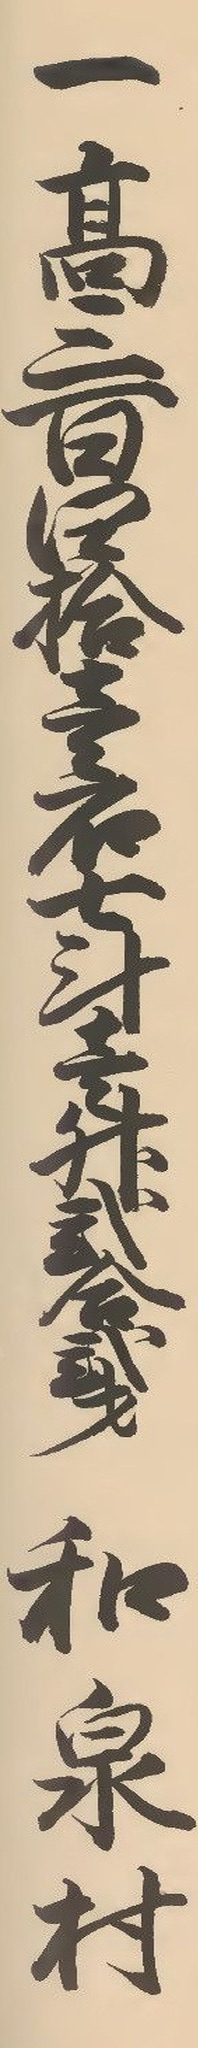一高三百四拾壱石七斗壱升弐合弐才和泉村
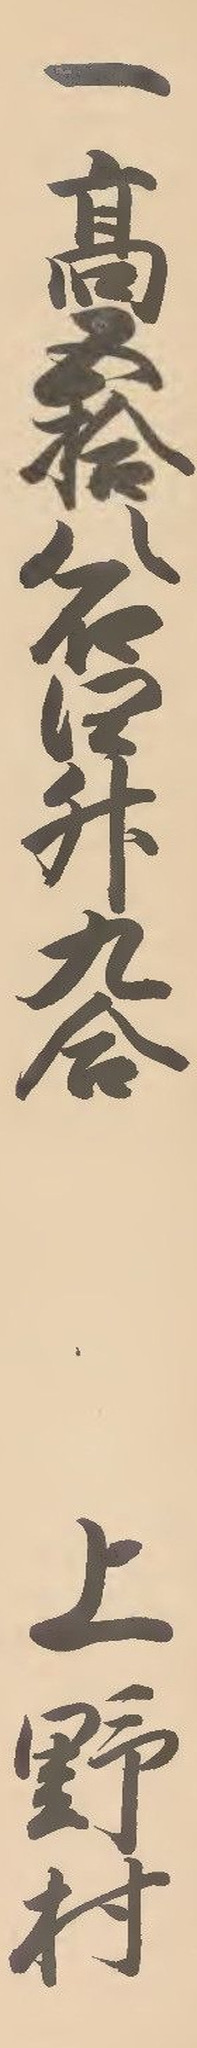一高五拾八石四升九合上野村
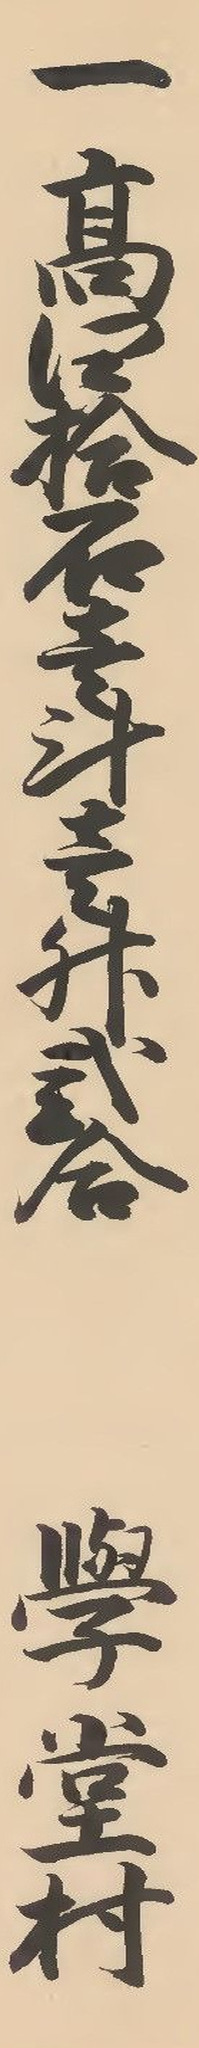一高四拾石壱斗壱升弐合学堂村
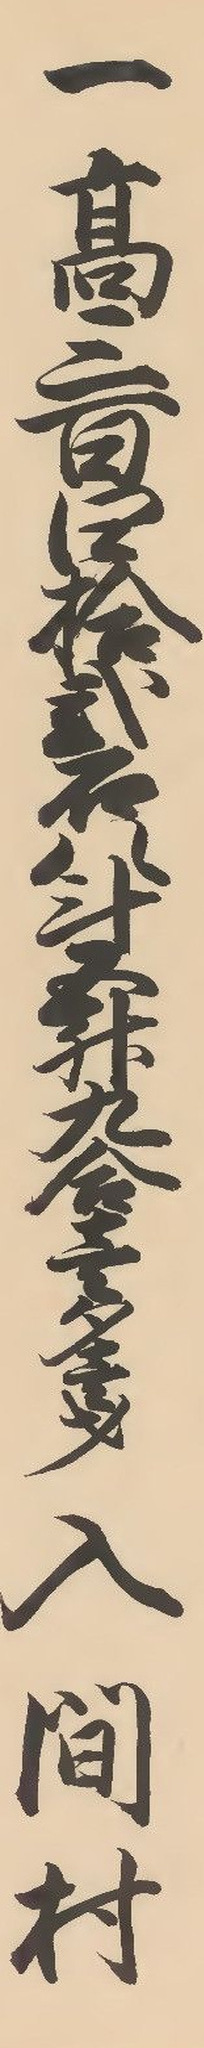一高三百四拾弐石八斗五升九合壱勺壱才入間村
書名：武蔵国郷帳　上
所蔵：国立公文書館 National Archives of Japan
